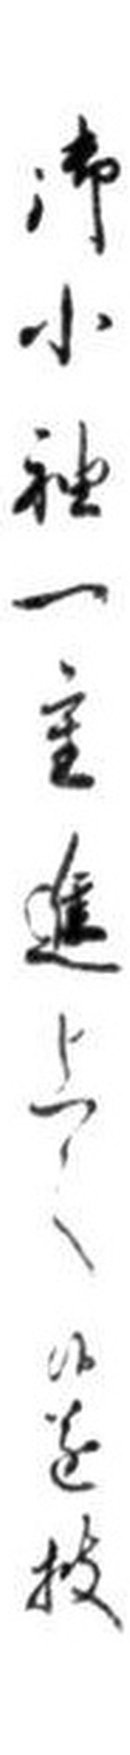御小袖一重進上之候遂披
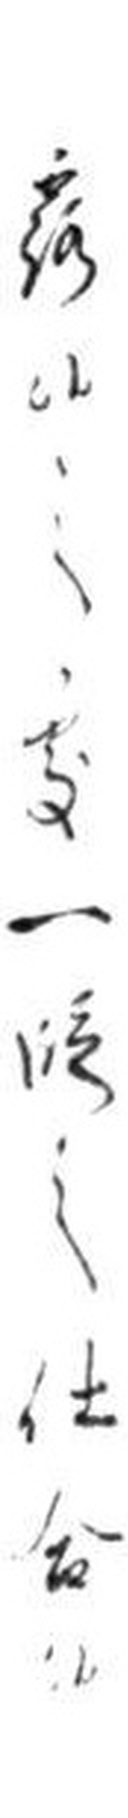露候之処一段之仕合候
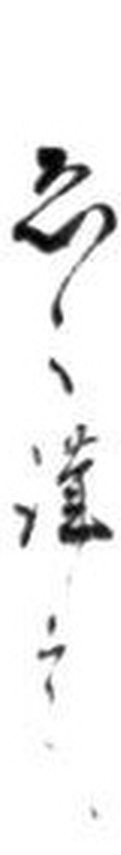恐々謹言
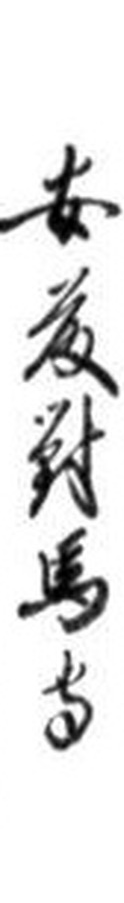安藤対馬守
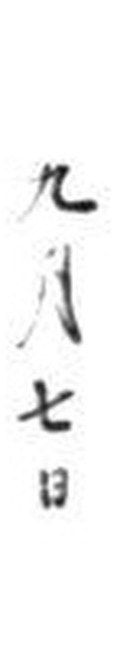九月七日
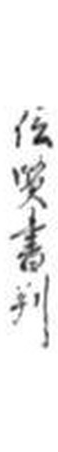信賢書判
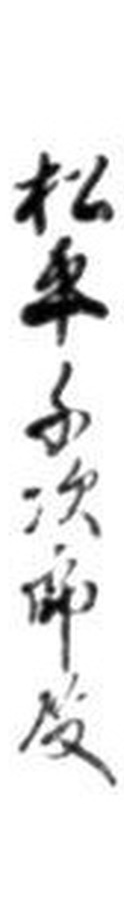松平千次郎殿
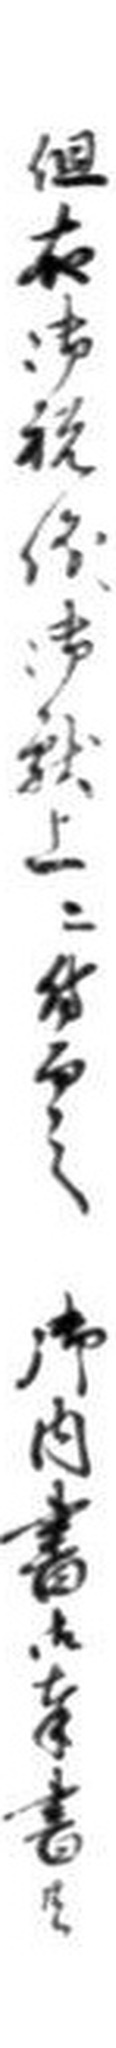但右御祝儀御献上ニ付而之御内書御奉書共
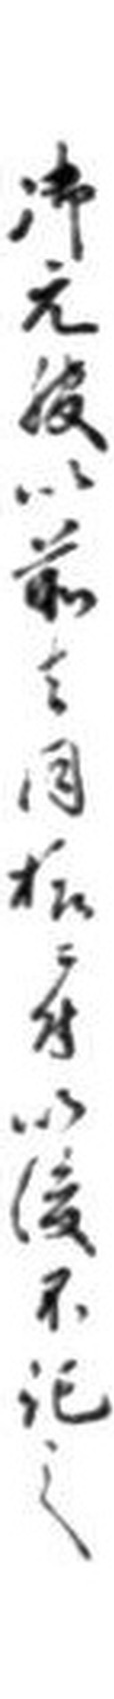御元服以前と同様ニ付以後不記之
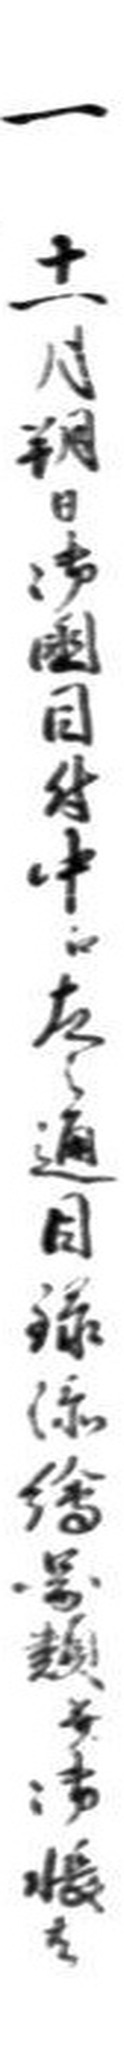一十一月朔日御国目付中江左之通目録添絵図類幷御帳共
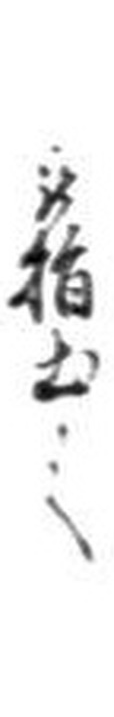被指出之
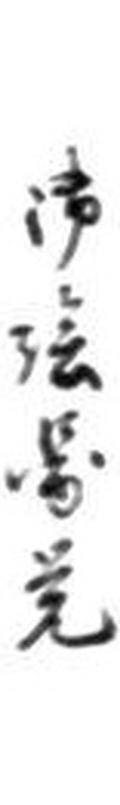御絵図覚
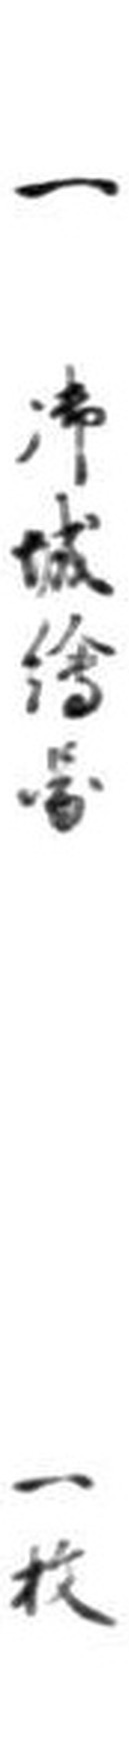一御城絵図一枚
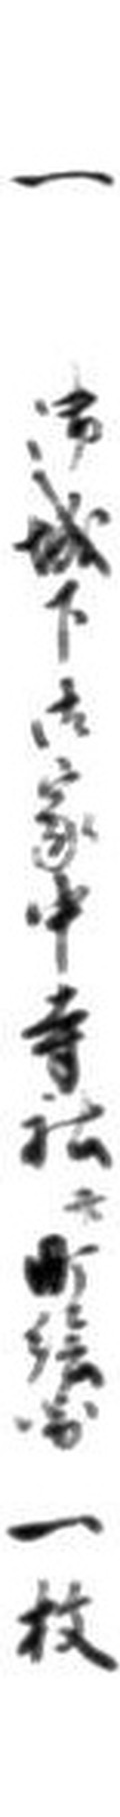一御城下御家中寺社幷町絵図一枚
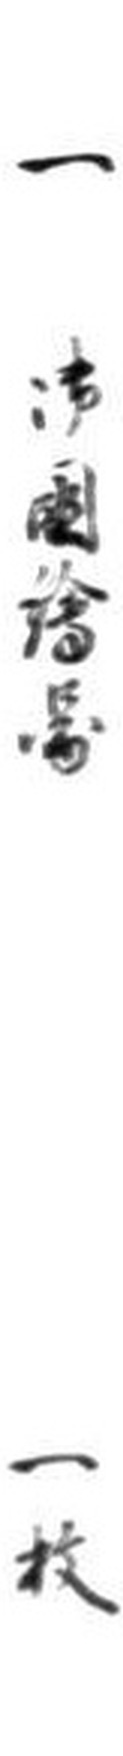一御国絵図一枚
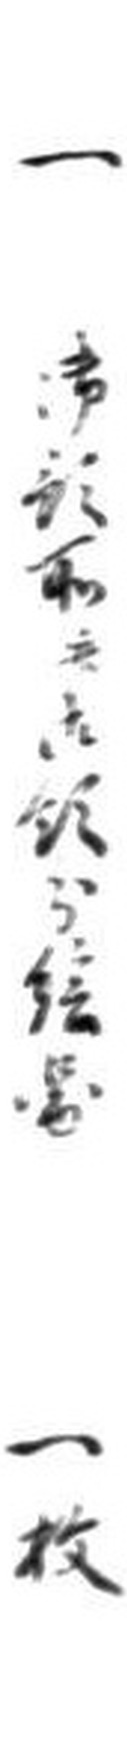一御領所幷御領分絵図一枚
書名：家譜 三十九 宗矩公 享保十年
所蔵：福井県文書館 Fukui Prefectural Archives
